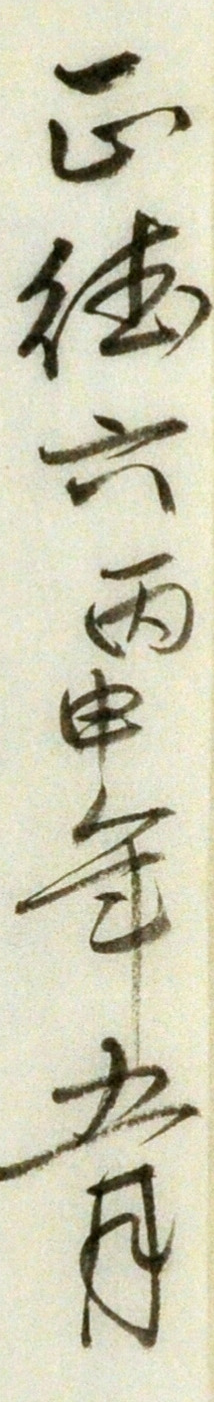正徳六丙申年五月
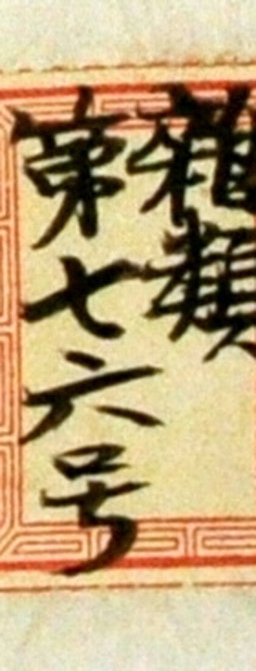第七六号

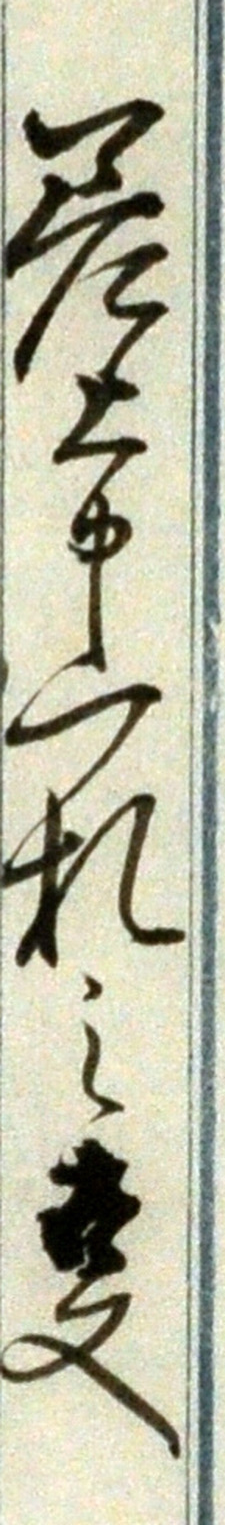差上申一札之事
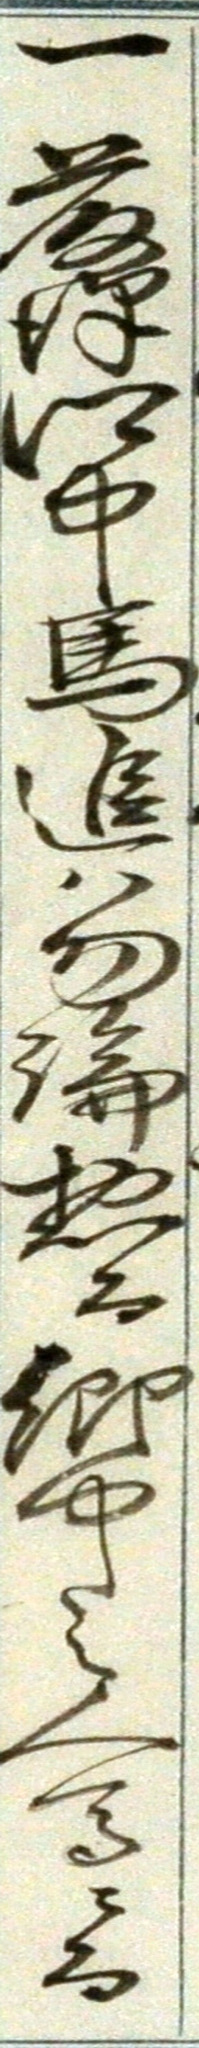一藤澤郷中馬追は勿論惣而郷中之人馬にて
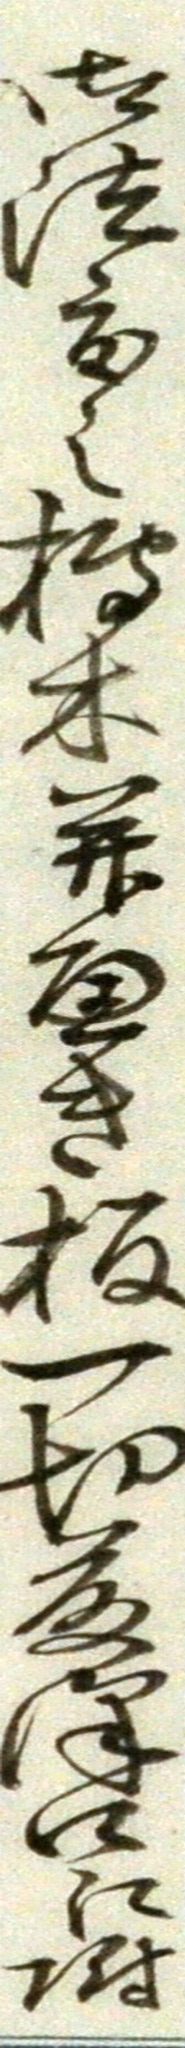御法度之榑木併へき板一切藤澤郷え附
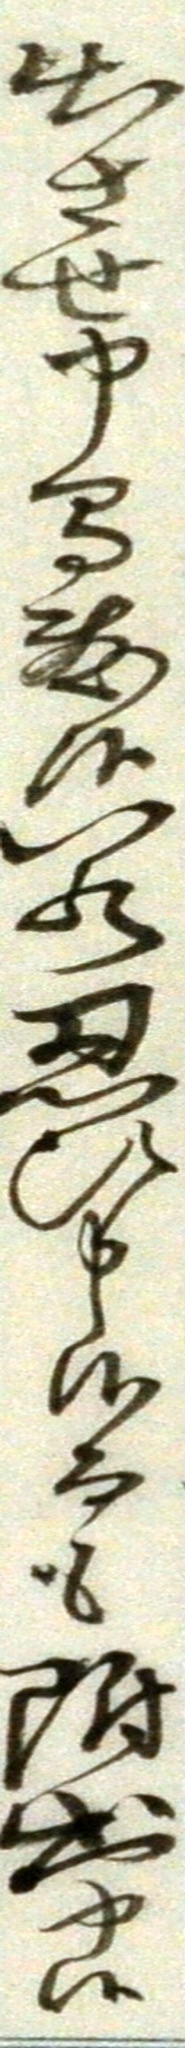出させ申間敷候若忍ひ申候ても附出申候
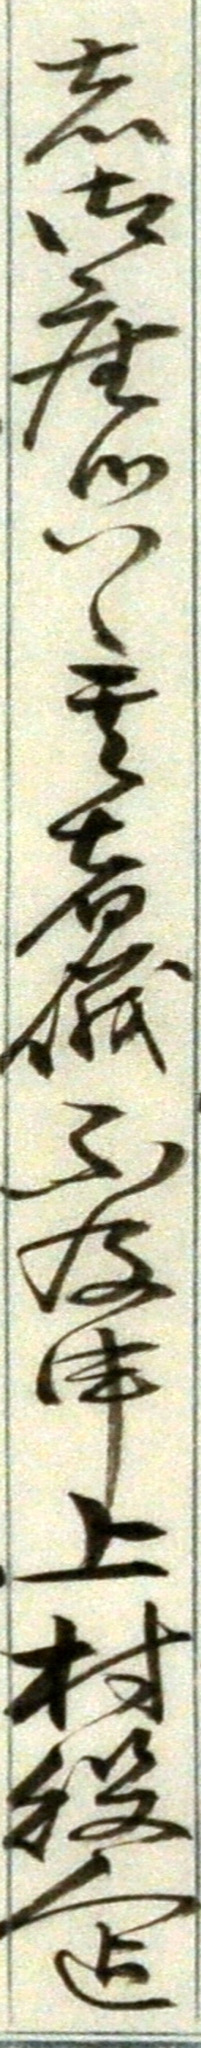者御座候はゝ其者儀不及申上村役人迄
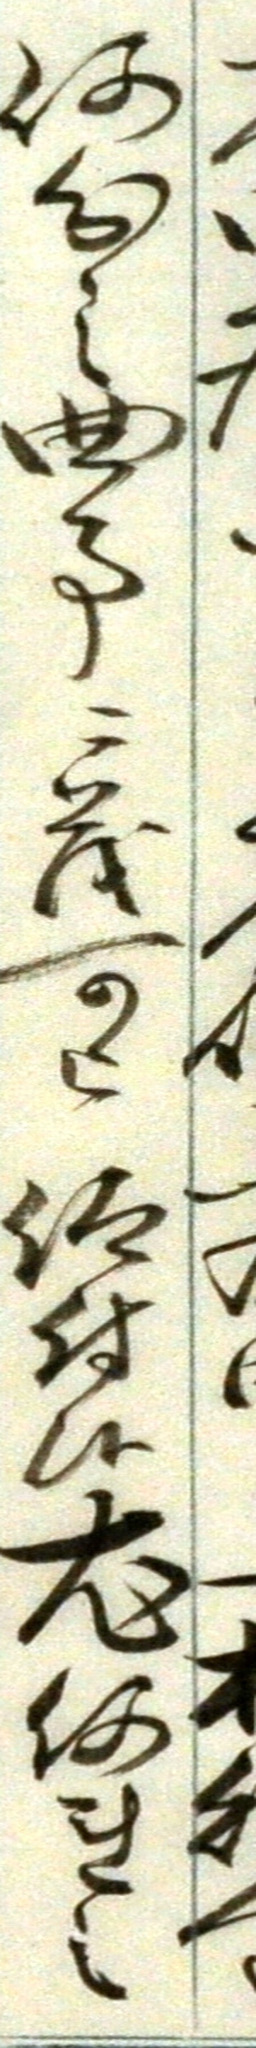何分之曲事にも可被仰付候尤何れ之
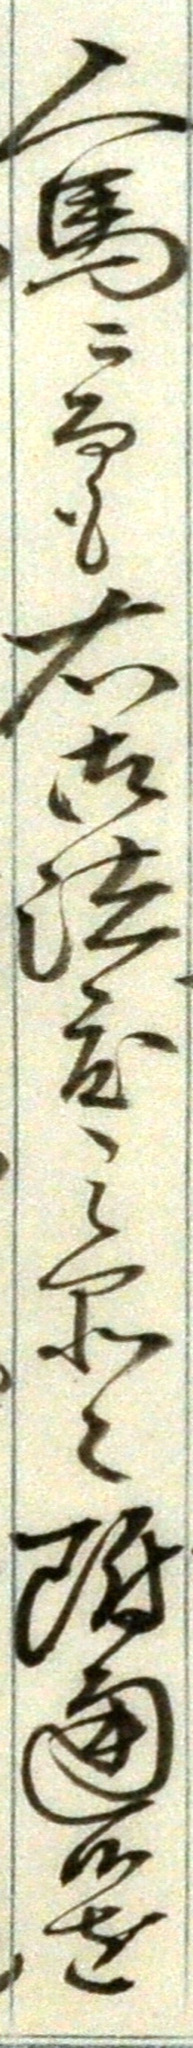人馬にても右御法度之品々附通候を
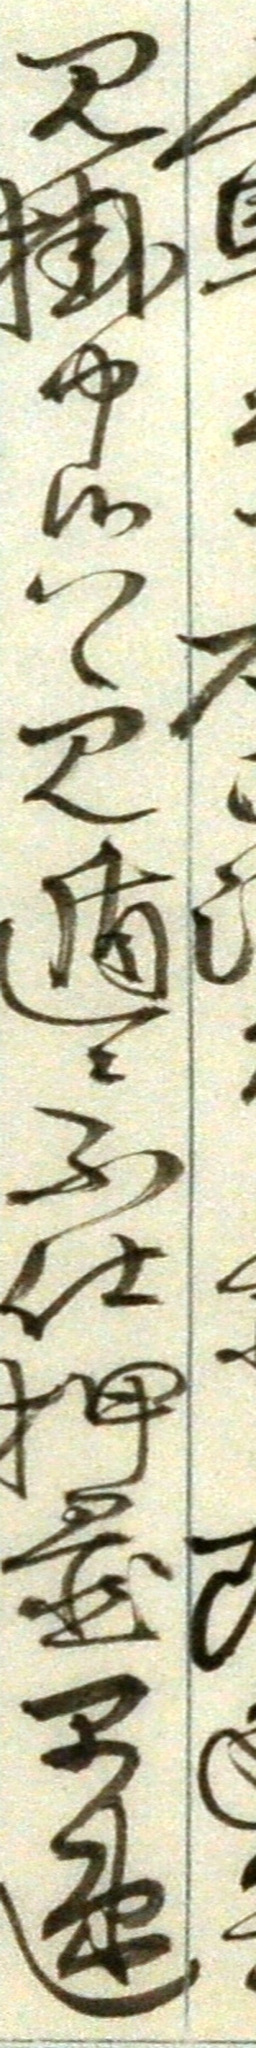見掛申候はゝ見遁に不仕押置早速
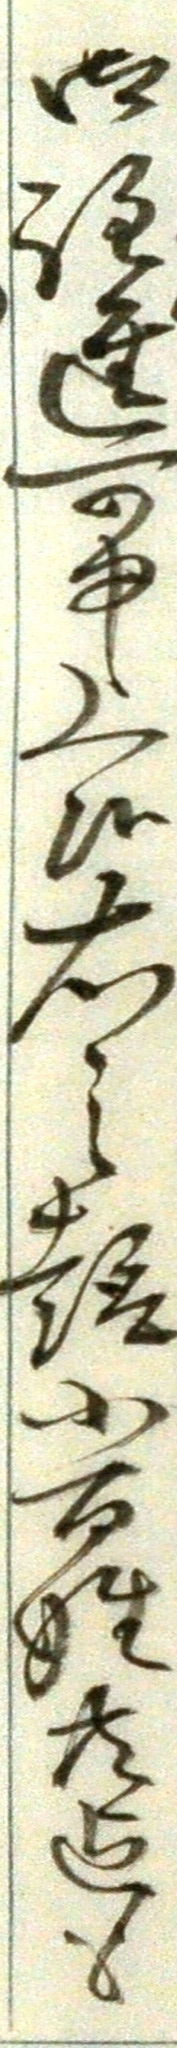御注進可申上候右之趣小百姓共迄も
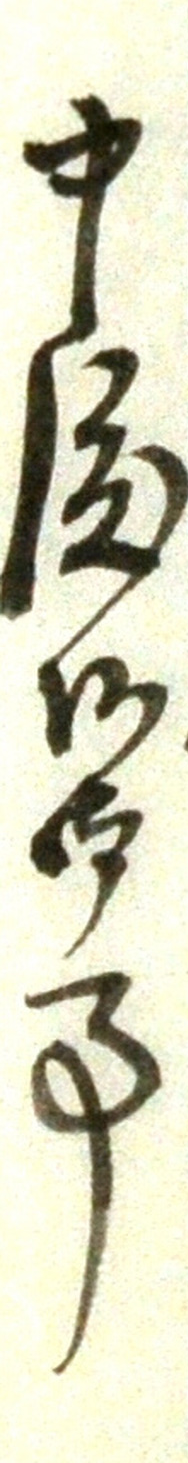申渡候御事

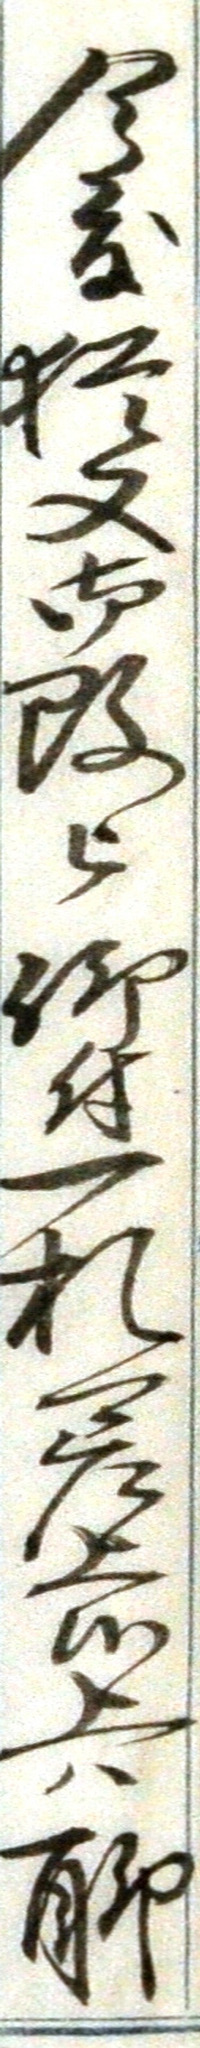今度猶又御改被仰付一札差上候上ハ聊
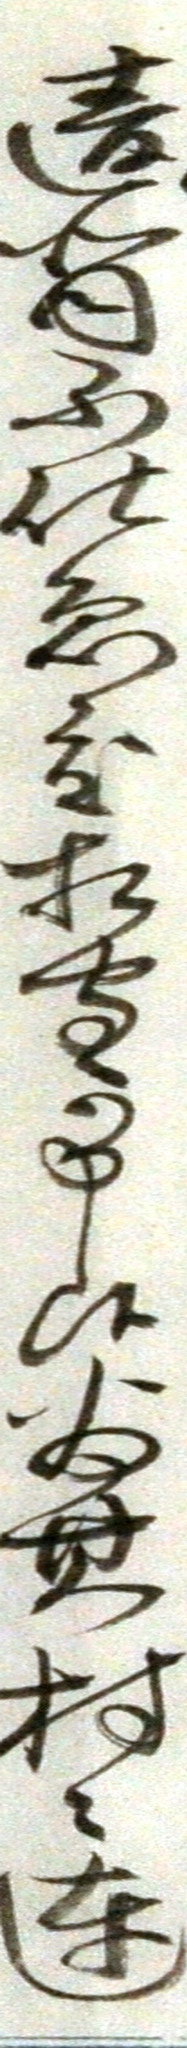違背不仕急度相守可申候為其村々連
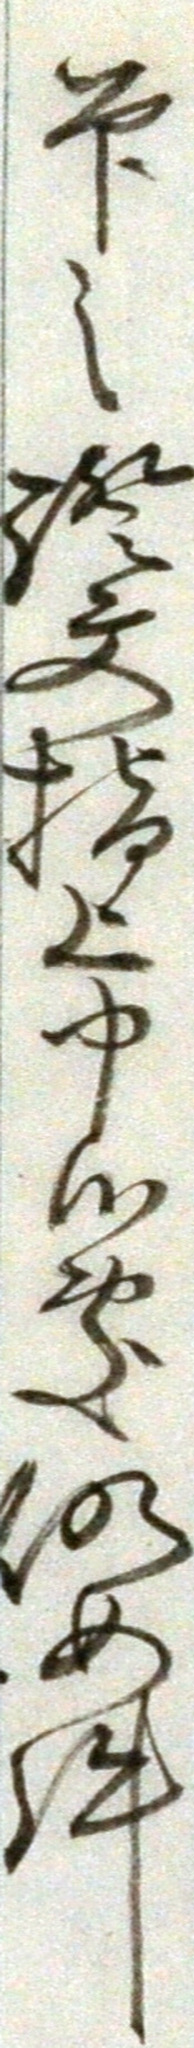印之證文指上申候処仍如件
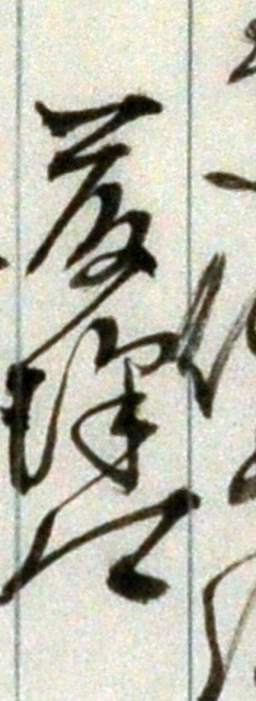藤澤郷
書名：藤沢郷中馬ニ関スル御法度請状
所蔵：伊那市立高遠町図書館・合同会社AMANE
